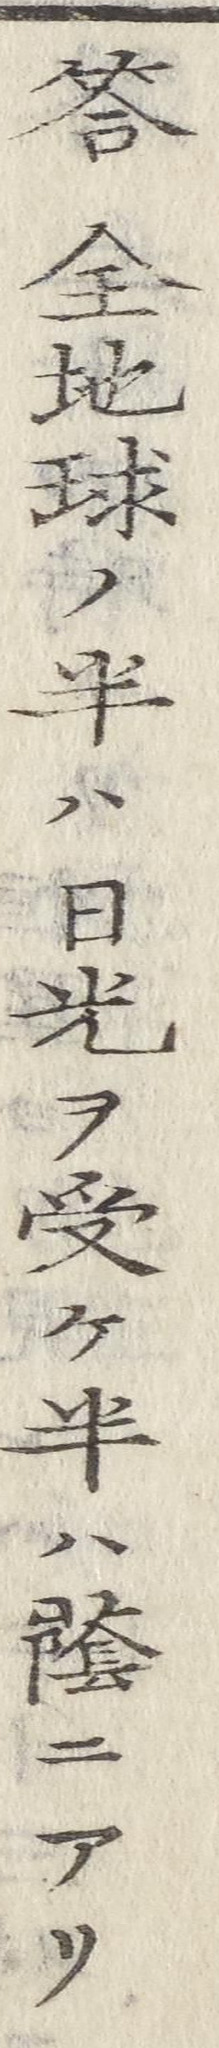答全地球ノ半ハ日光ヲ受ケ半ハ蔭ニアリ
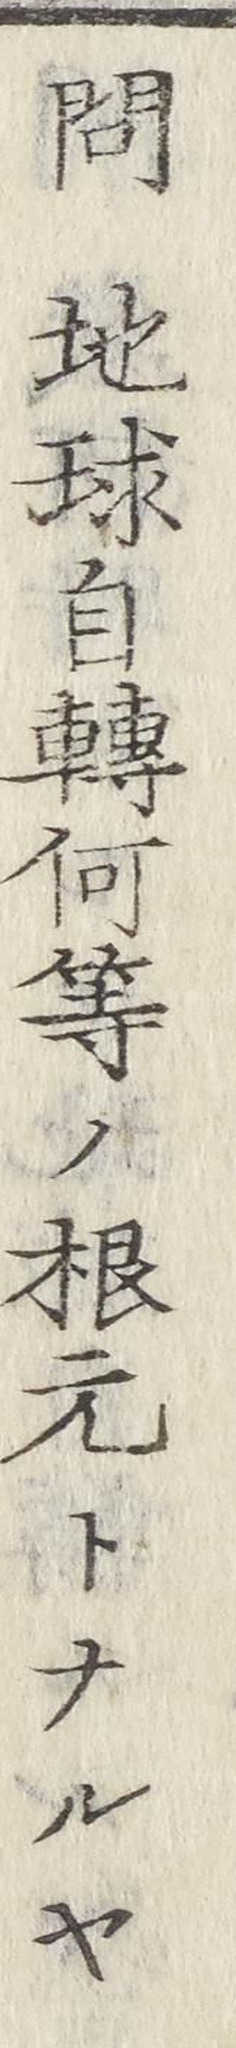問地球自転何等ノ根元トナルヤ
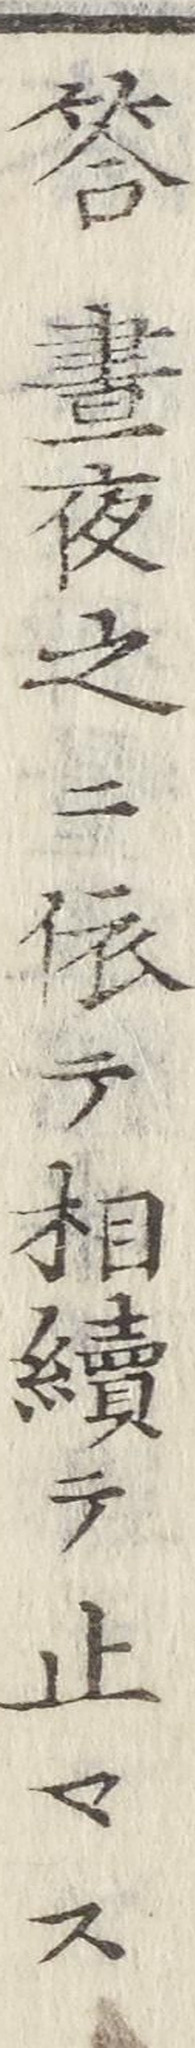答昼夜之ニ依テ相続テ止マス
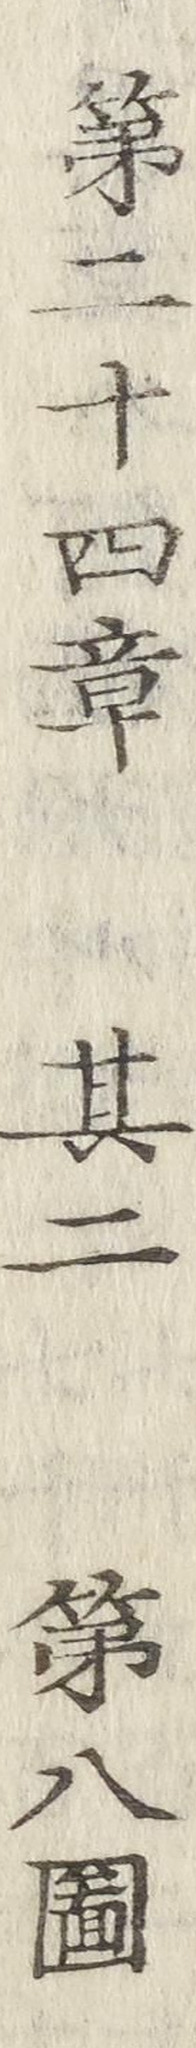第二十四章其二第八図
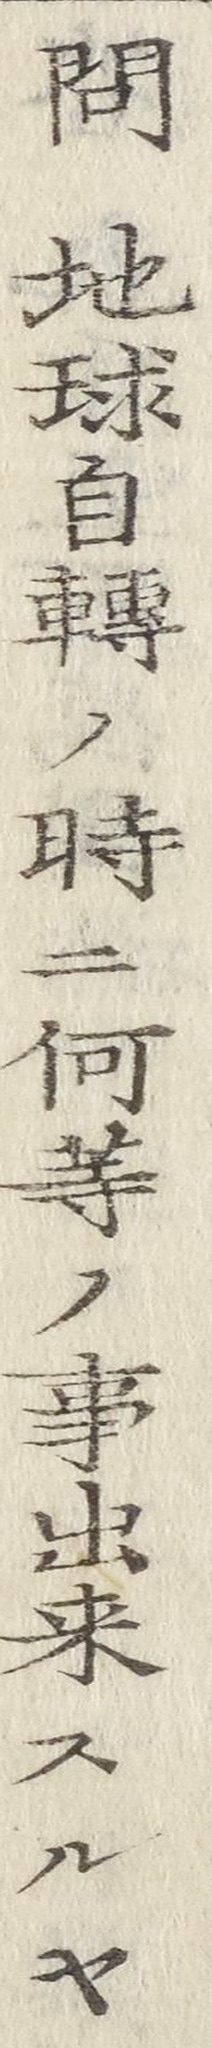問地球自転ノ時ニ何等ノ事出来スルヤ
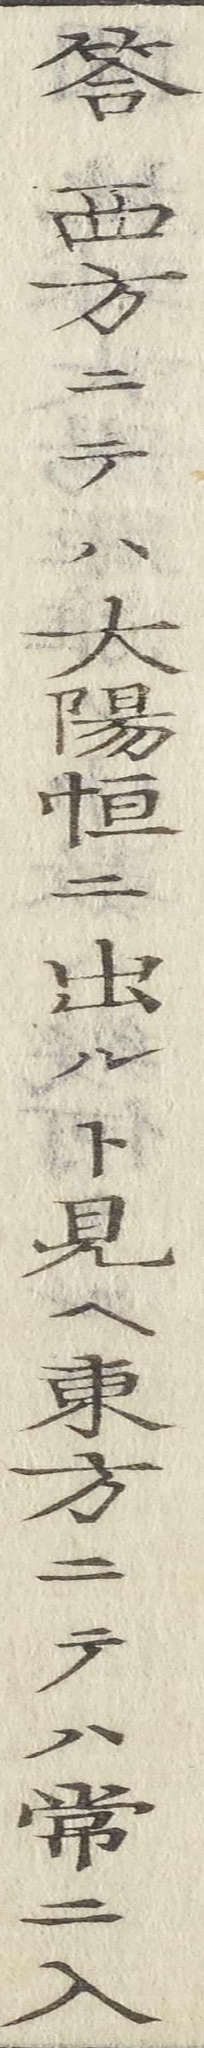答西方ニテハ大陽恒ニ出ルト見ヘ東方ニテハ常ニ入
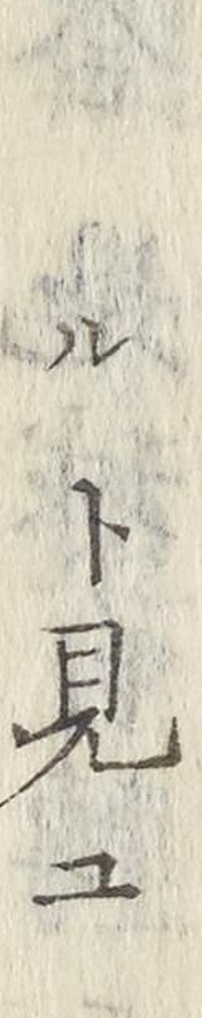ルト見ユ
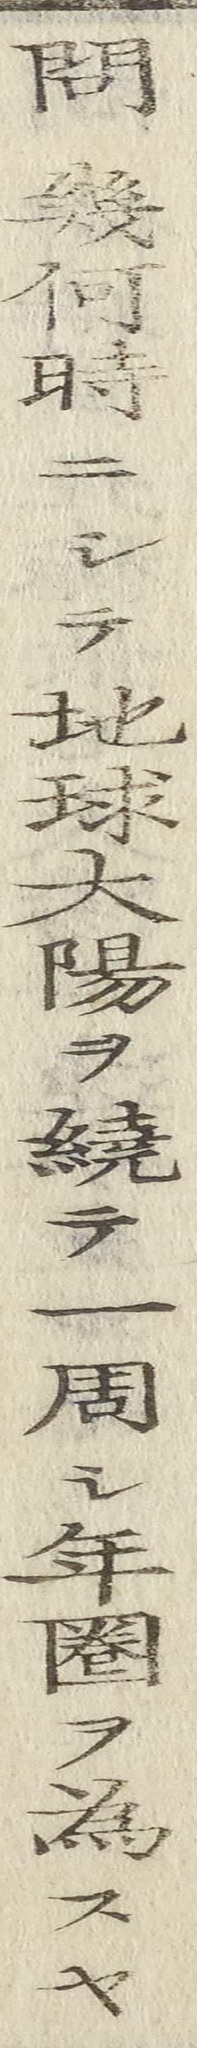問幾何時ニシテ地球大陽ヲ繞テ一周シ年圏ヲ為スヤ
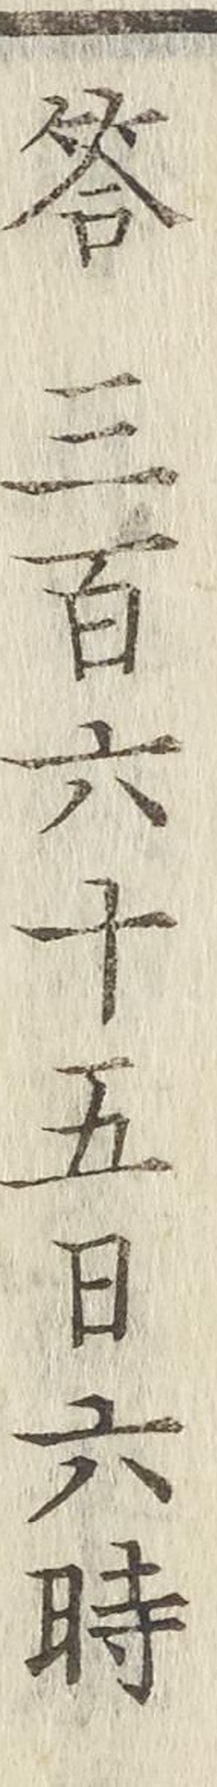答三百六十五日六時
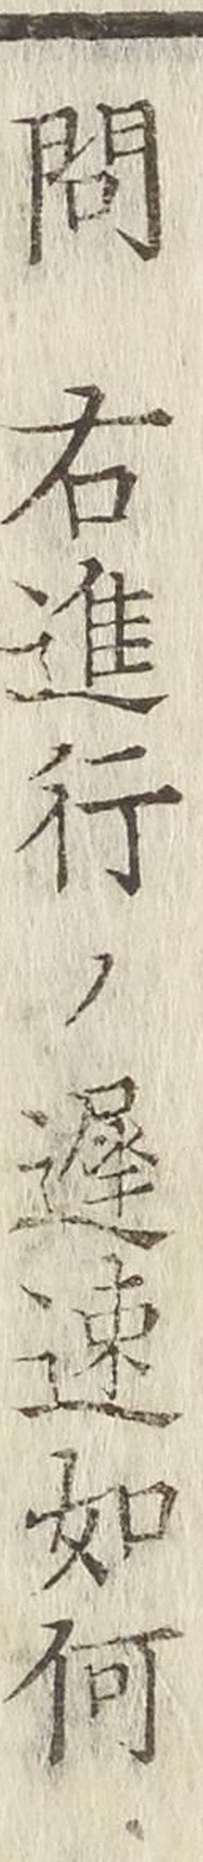問右進行ノ遅速如何
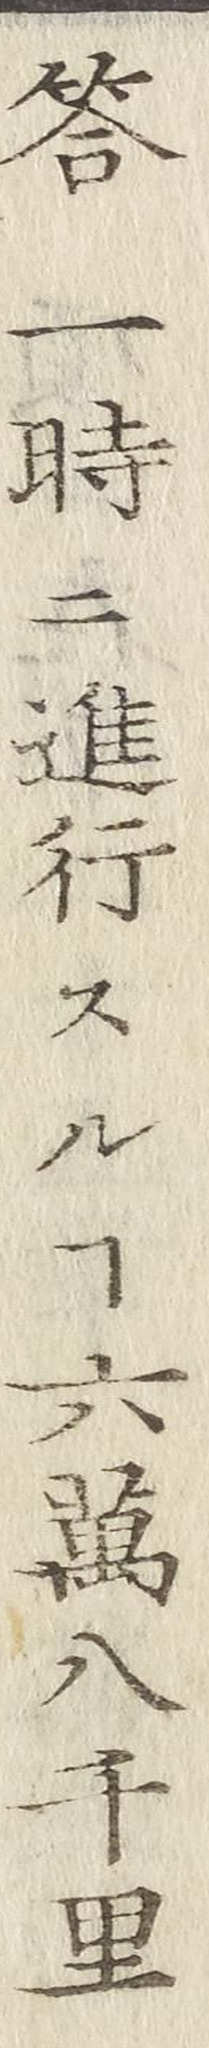答一時ニ進行スルコト六万八千里
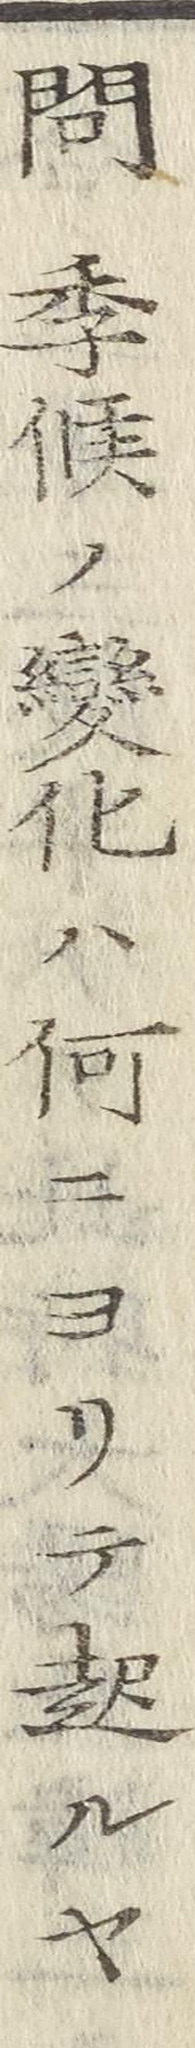問季候ノ変化ハ何ニヨリテ起ルヤ
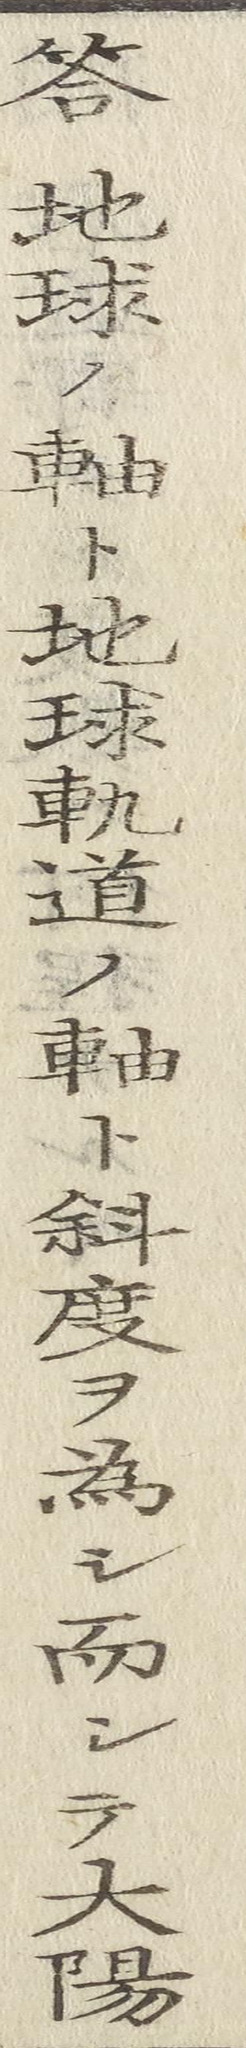答地球ノ軸ト地球軌道ノ軸ト斜度ヲ為シ而シテ大陽
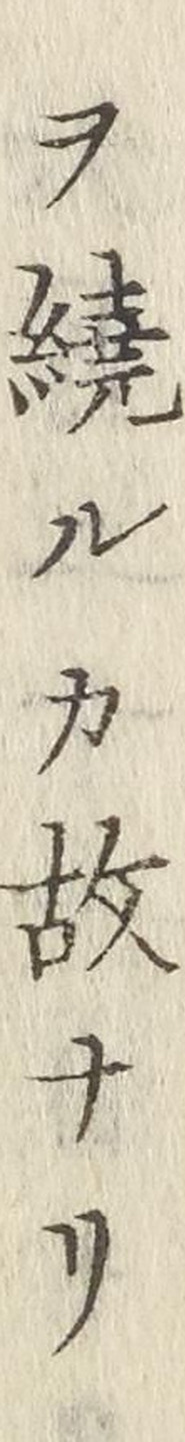ヲ繞ルカ故ナリ
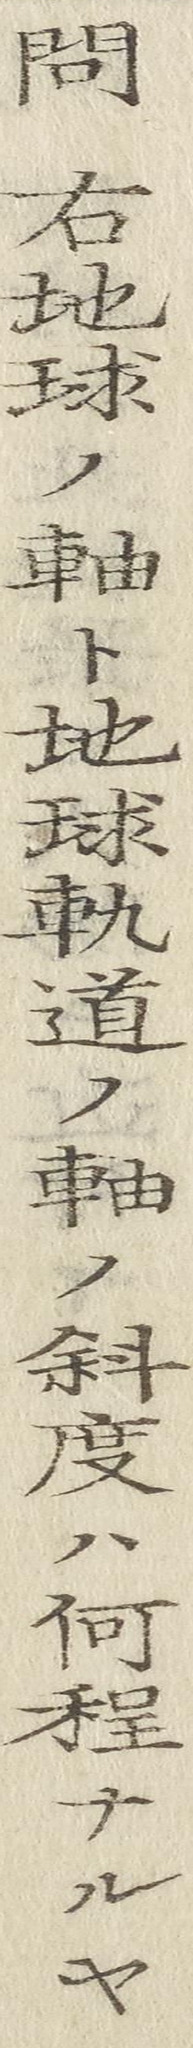問右地球ノ軸ト地球軌道ノ軸ノ斜度ハ何程ナルヤ
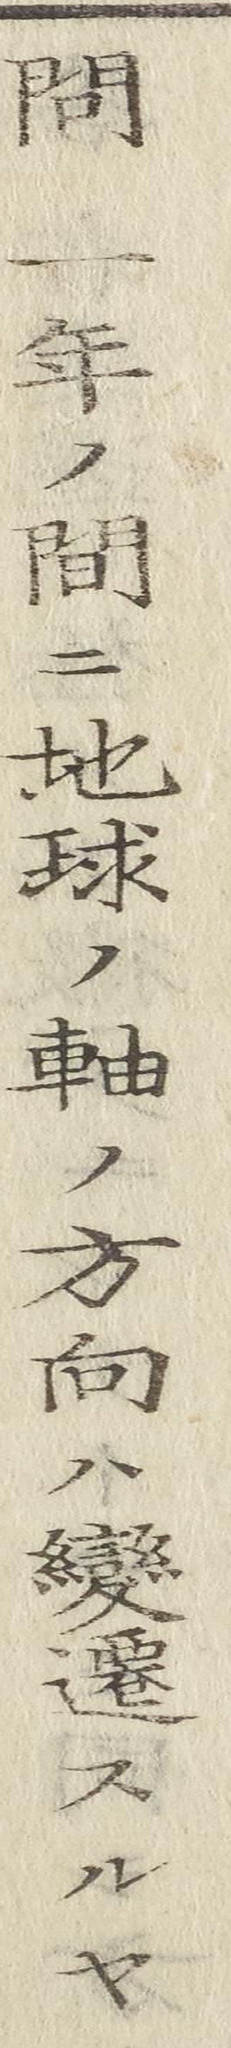問一年ノ間ニ地球ノ軸ノ方向ハ変遷スルヤ
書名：星学圖説　上
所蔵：東京大学地震研究所図書室 Earthquake Research Institute Library, The University of Tokyo, JAPAN
